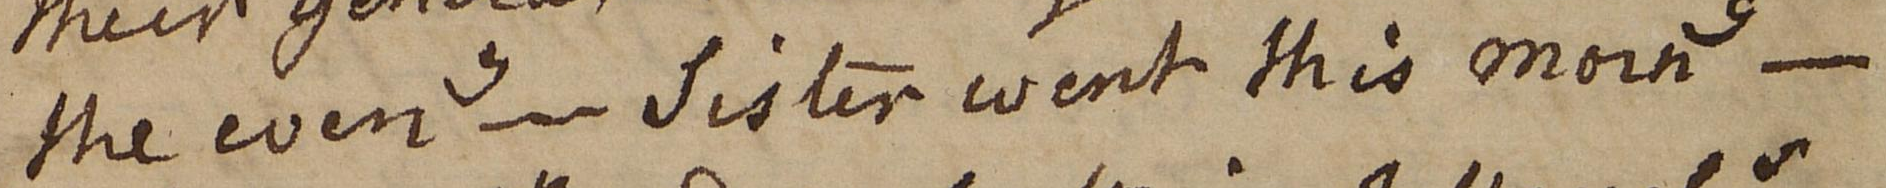the even^g- Sister went this morn^g-
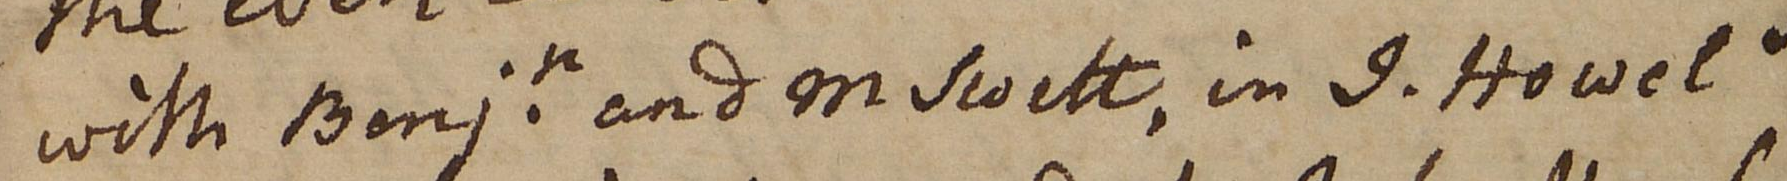with Bonj^r. and M Swett, in I. Howel^s
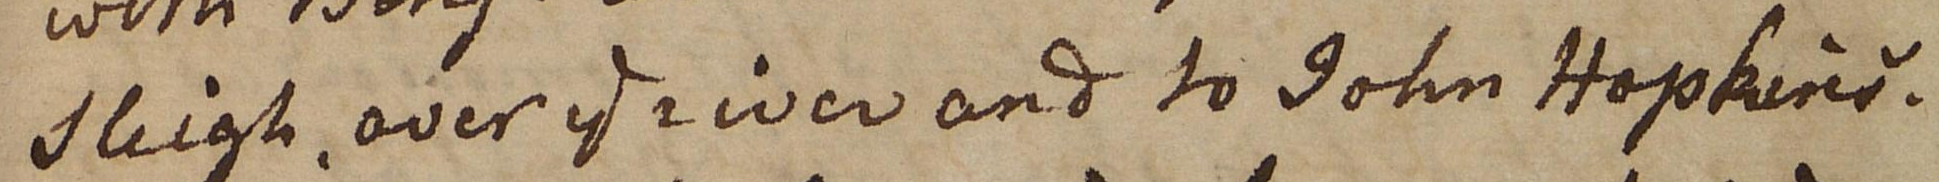sleigh, over y^e river and to John Hopkins^s.
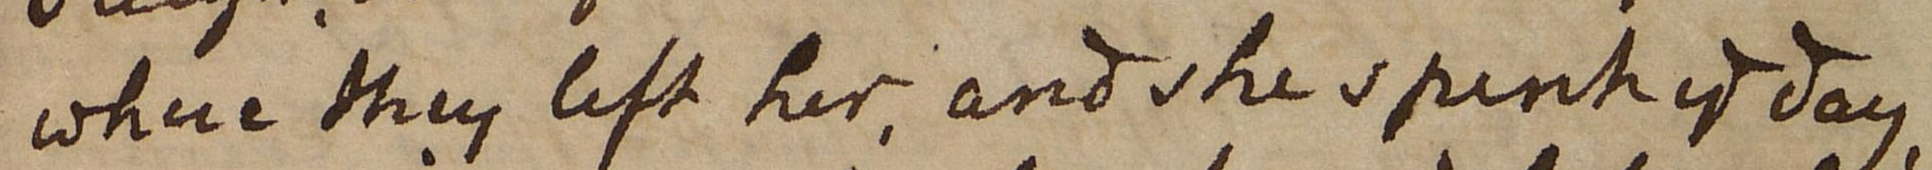where they left her, and she spent y^e day,
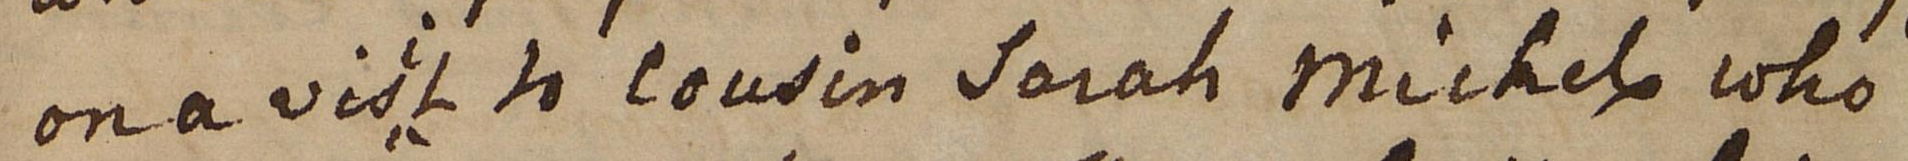on a vis^it to Cousin Sarah Michel who
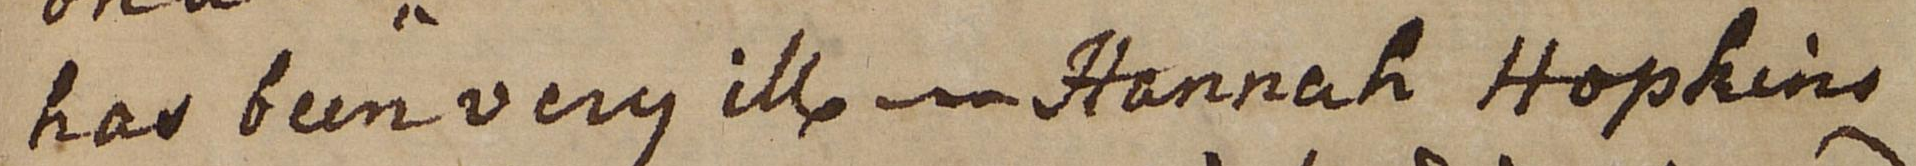has been very ill- Hannah Hopkins
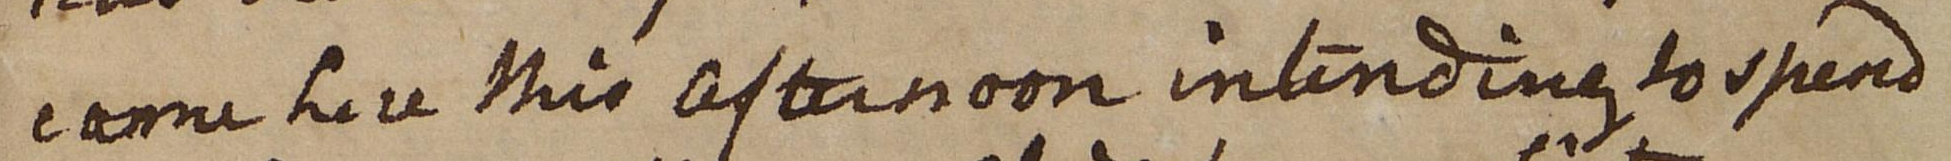came here this Afternoon intending to spend
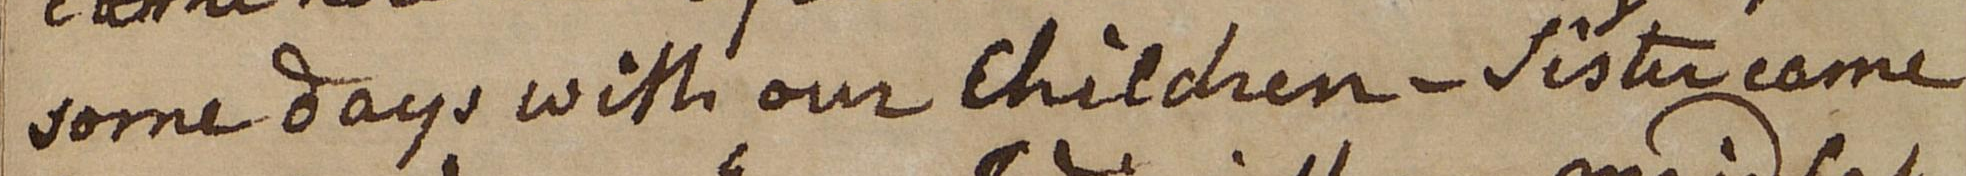some days with our children- Sister came
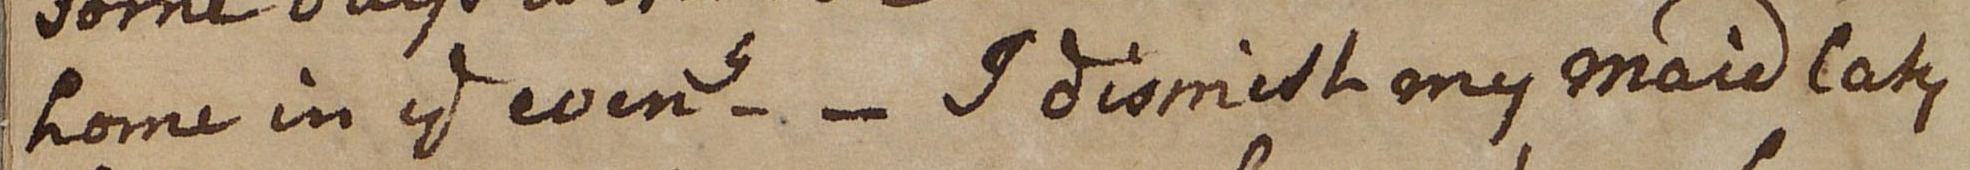home in y^e even^g- - I dismist my maid Caty
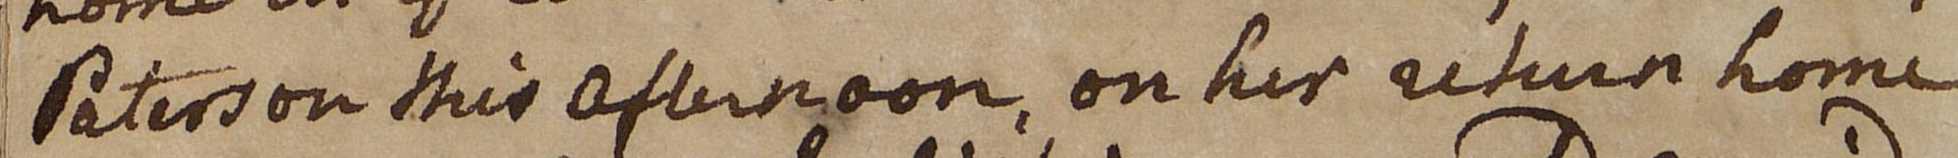Paterson this afternoon, on her return home
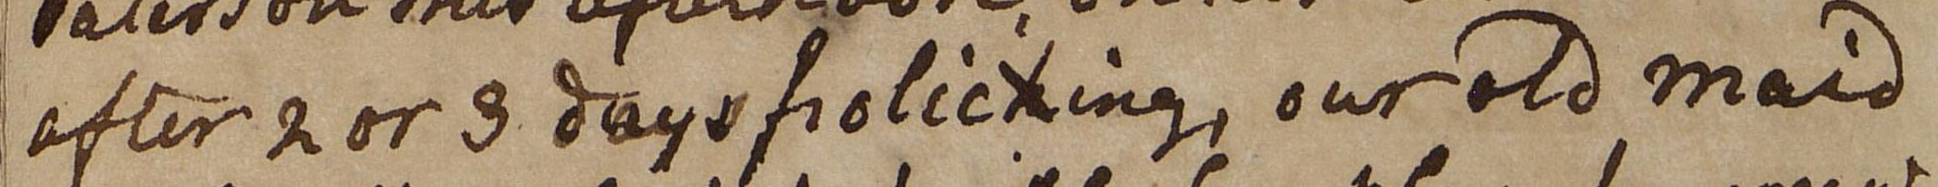after 2 or 3 days frolicking, our old maid
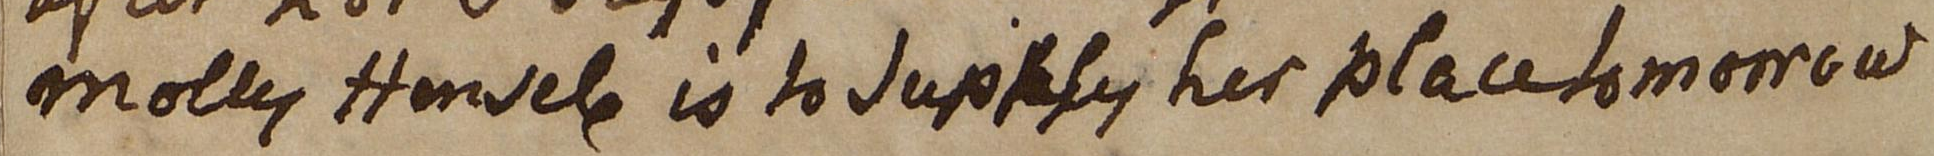Molly Hansel is to supply her place tomorrow
